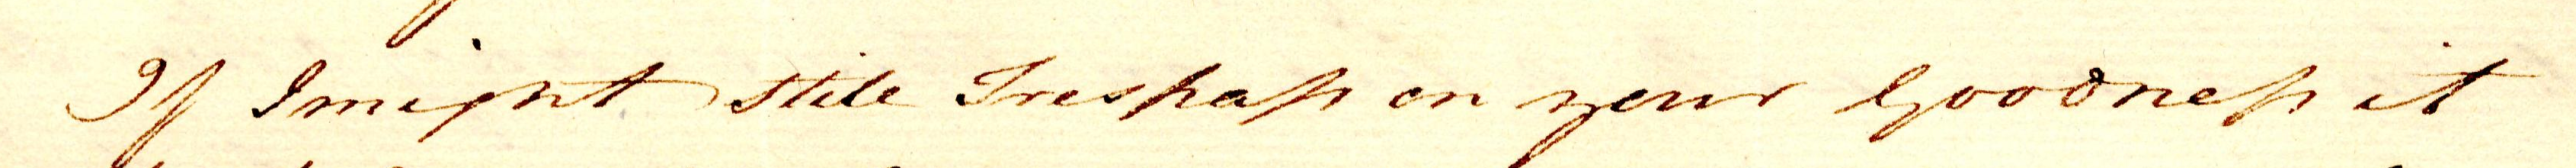If I might still Trespass on your Goodness it
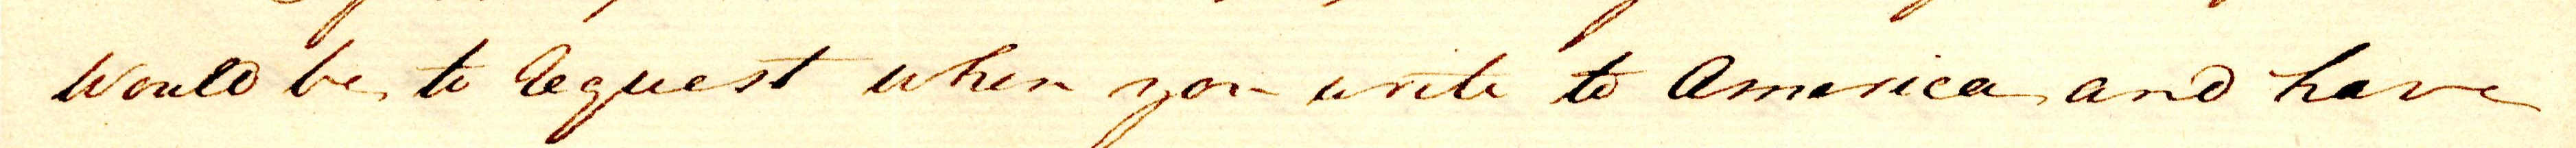would be to request when you write to America and have
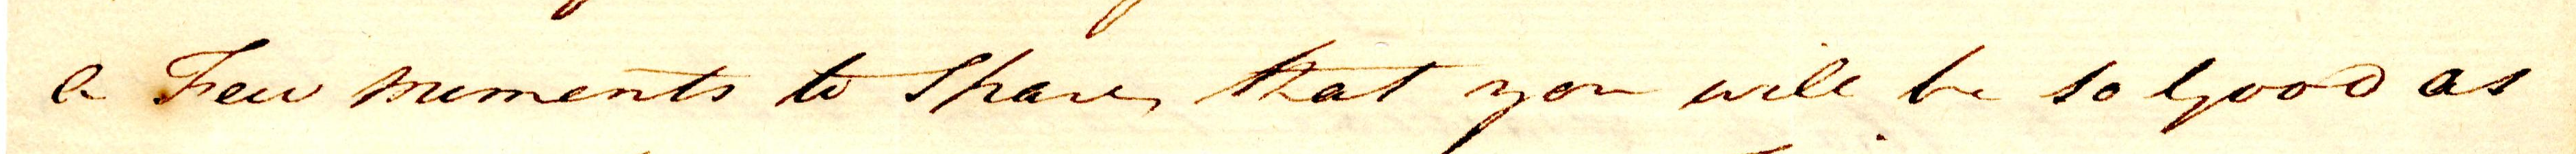a Few moments to spare that you will be Good as
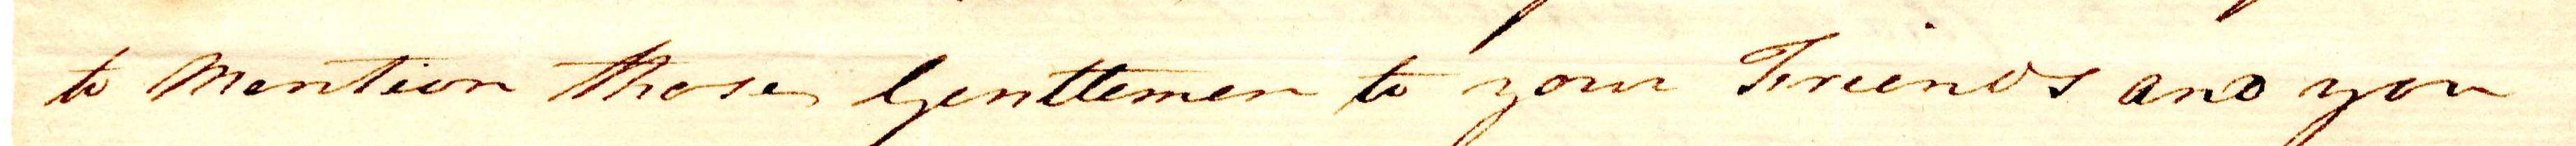to mention those Gentlemen to your Friends and you
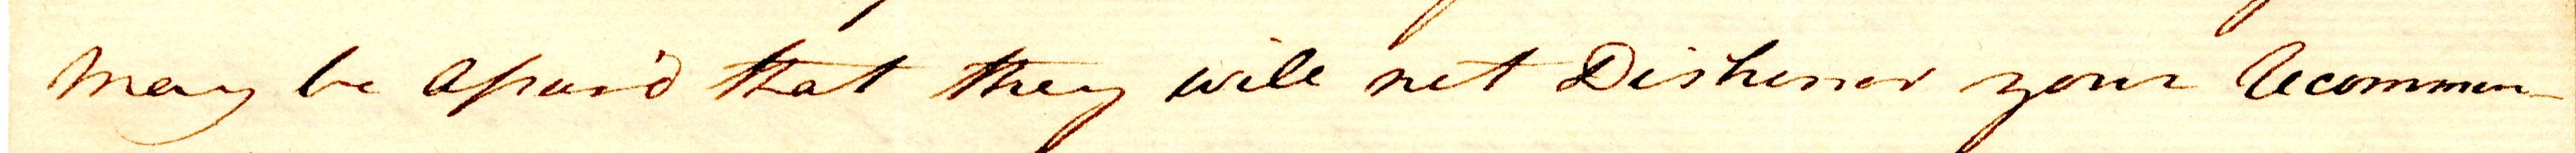may be assur'd that they will not Dishonour your recommen-
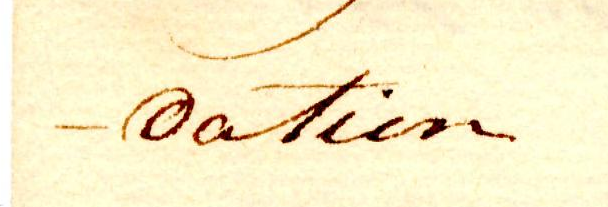-dation
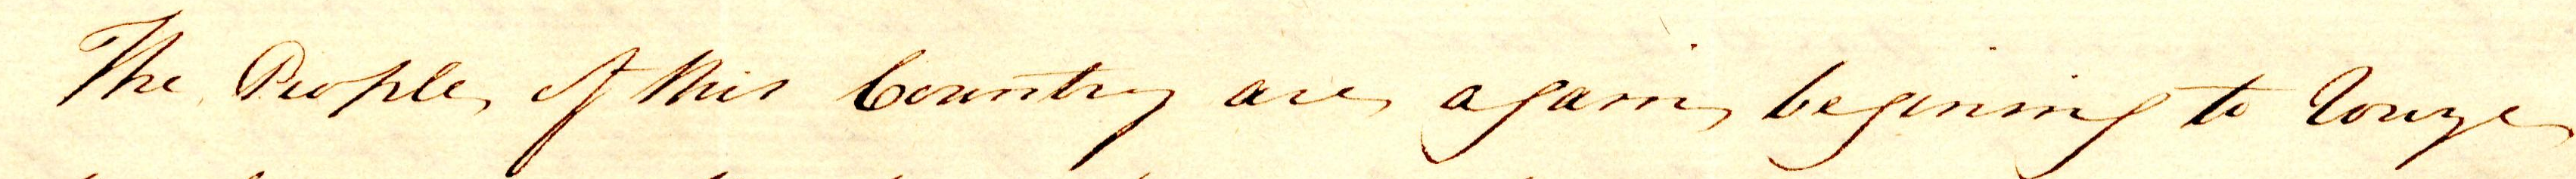The People of their Country are again beginning to rouze
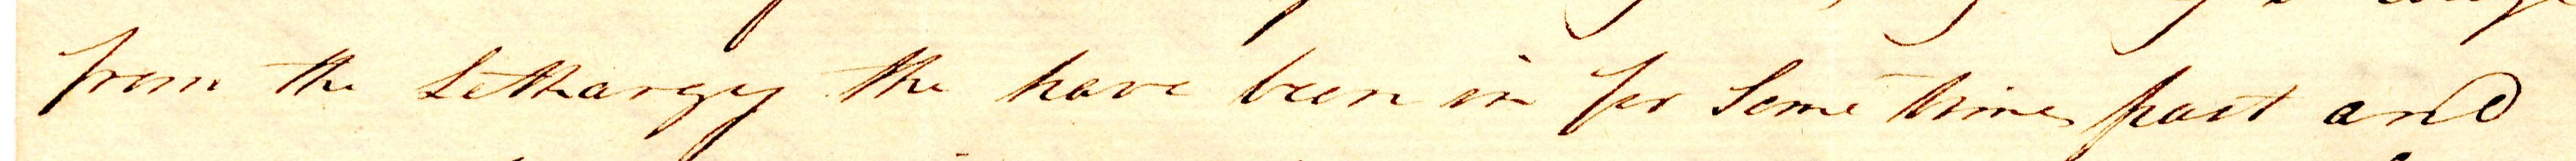from the Lethargy the have been in for some time past and
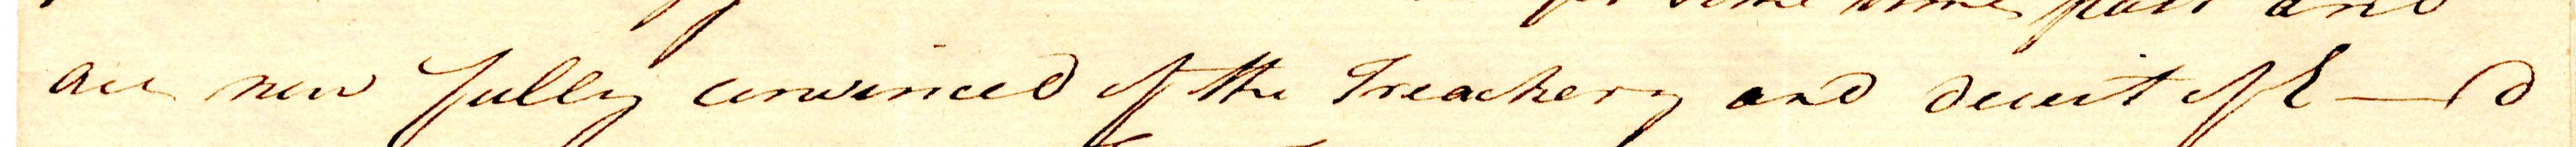are now fully convinced of the Treachery and deceit of E-d
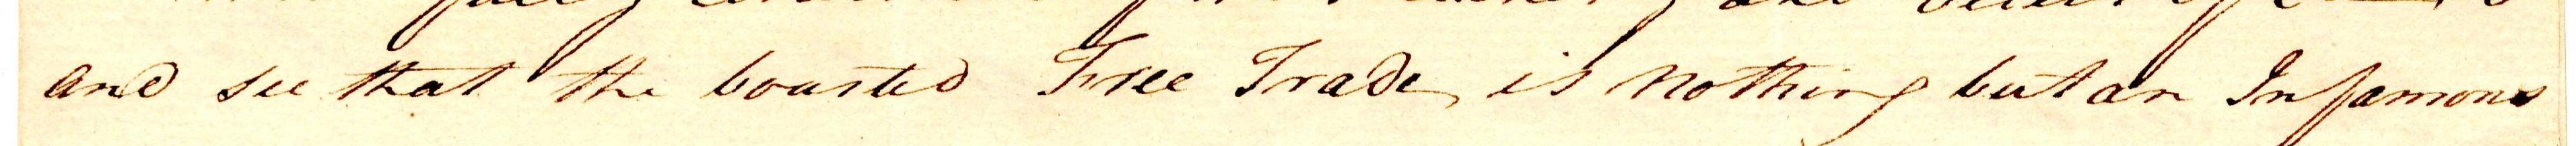and see that the boasted Free Trade is nothing but an Infamous
